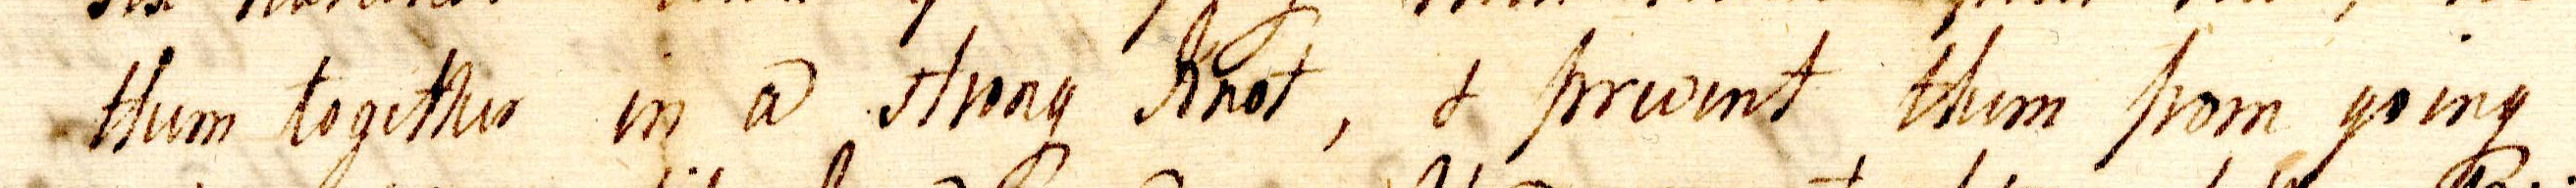them together in a strong Knot, & prevent them from going
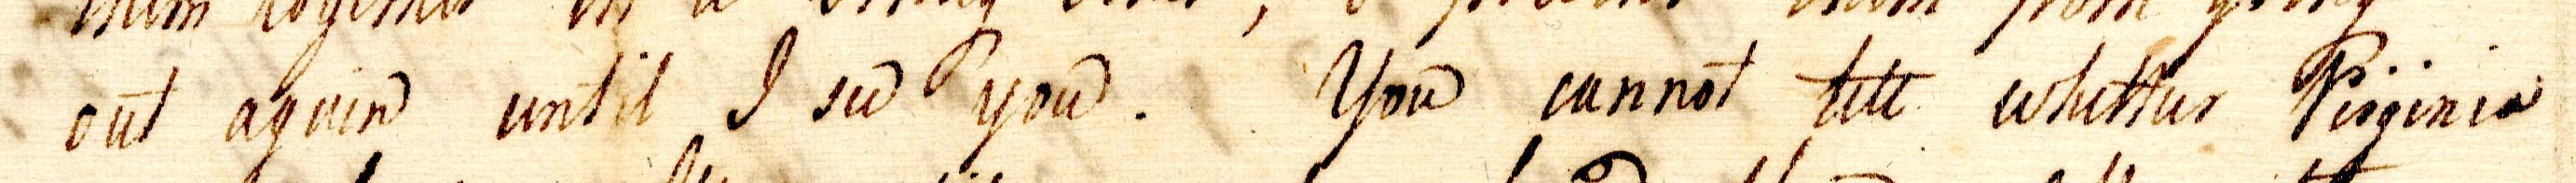out again until I see you. You cannot tell whether Virginia
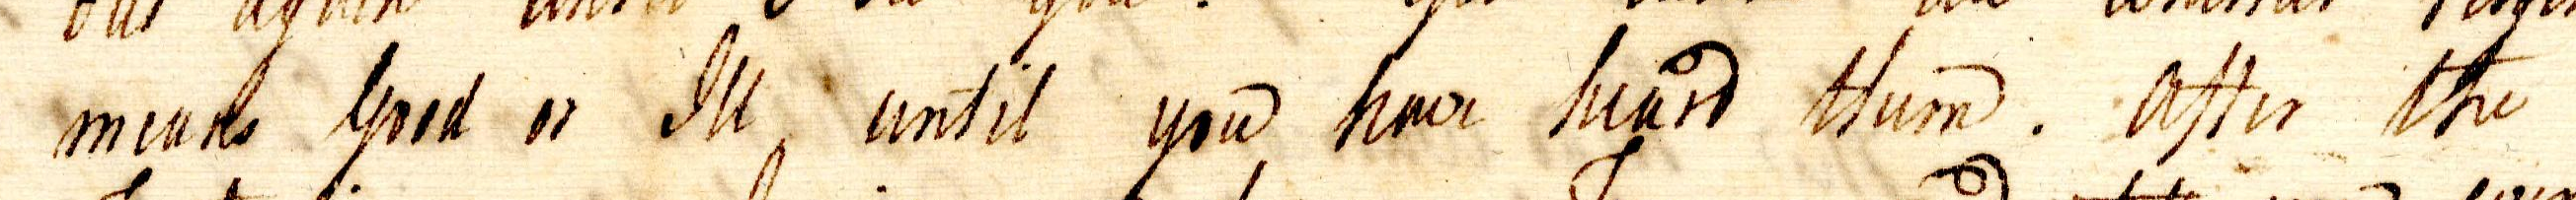means Good or Ill until you have heard them. After the
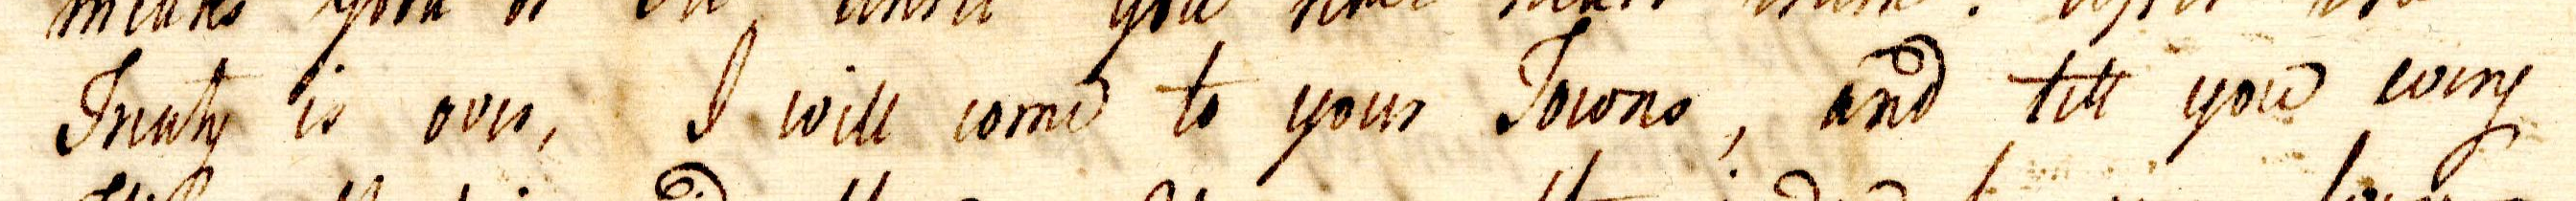Treaty is over, I will come to your Towns, and tell you every
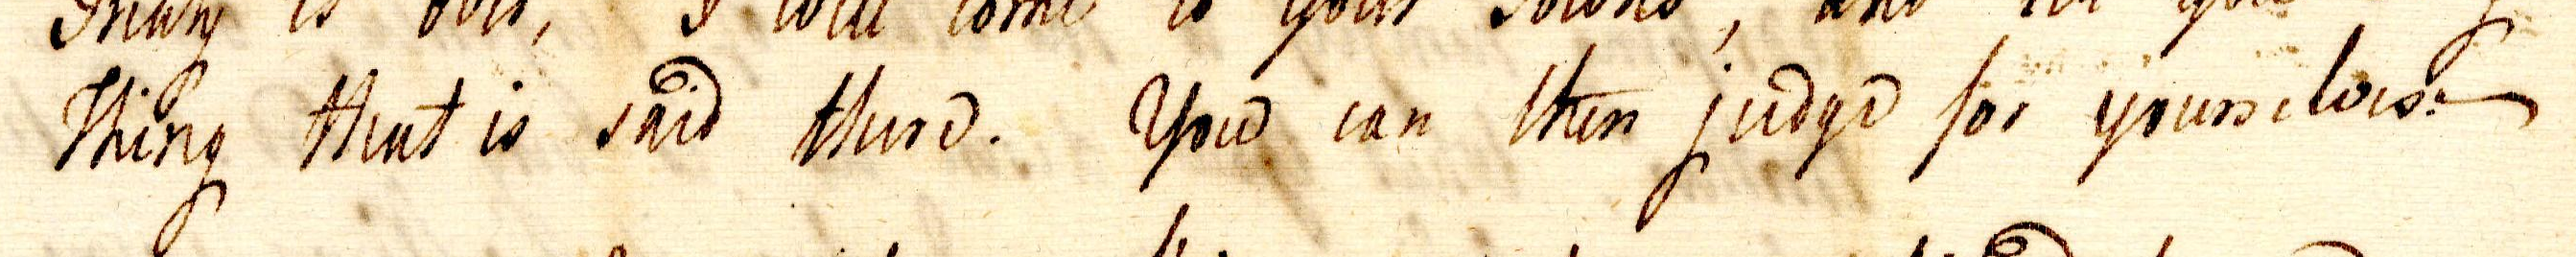thing that is said there. You can then judge for yourselves.-
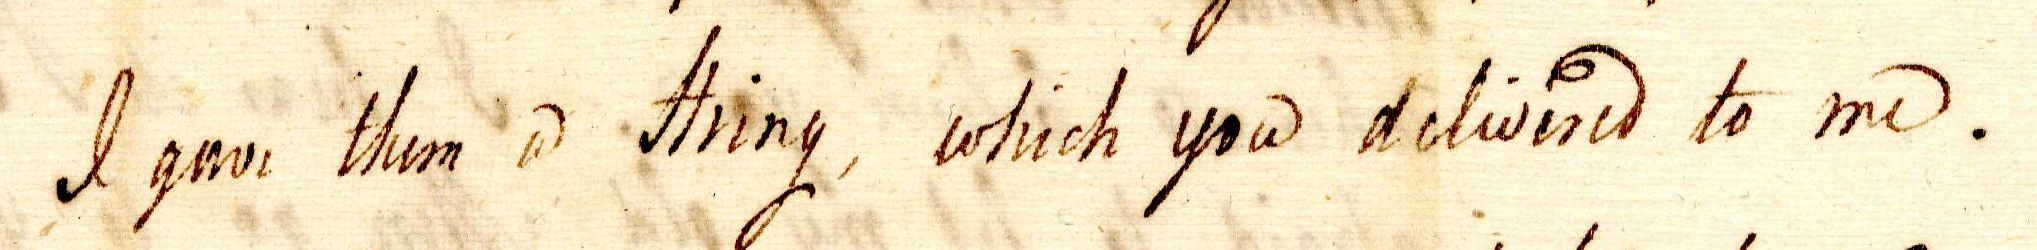I gave them a String, which you delivered to me.
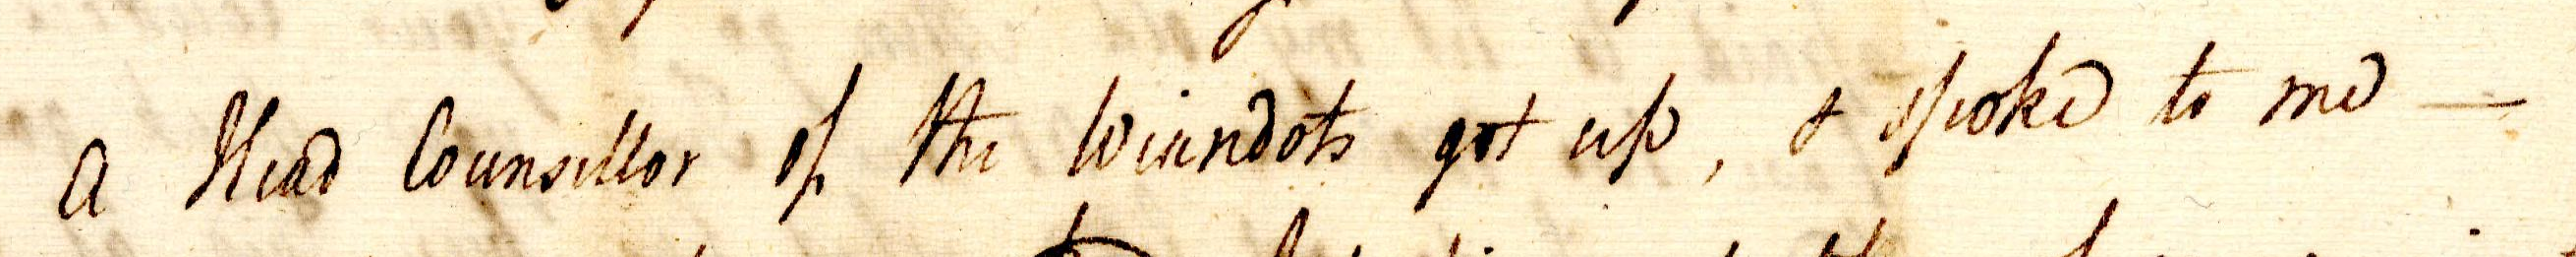A Head Counsellor of the Wiandots got up, & spoke to me-
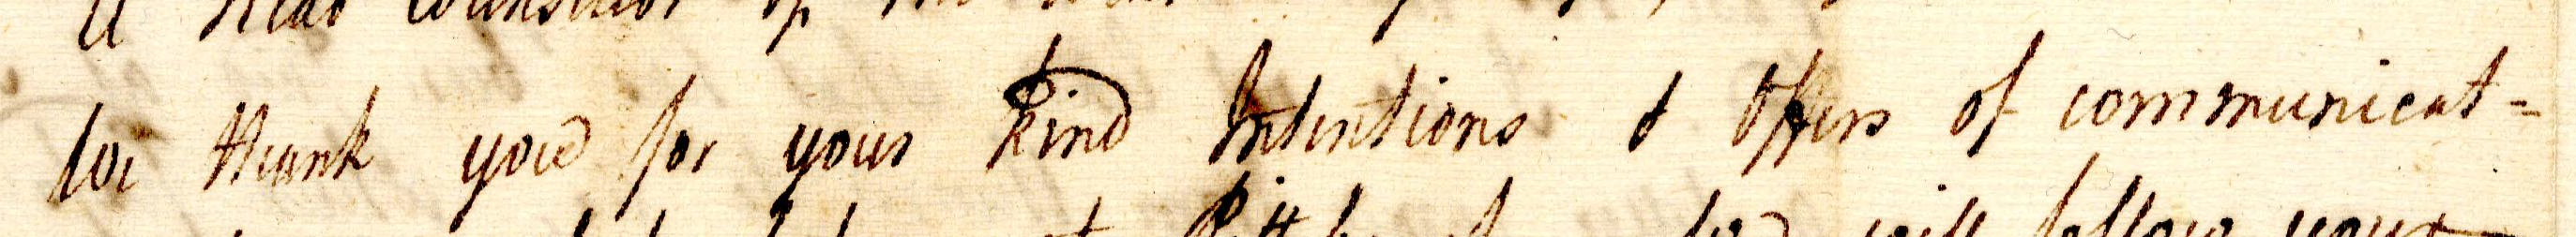We thank you for your kind Intentions & Offers of communicat-
